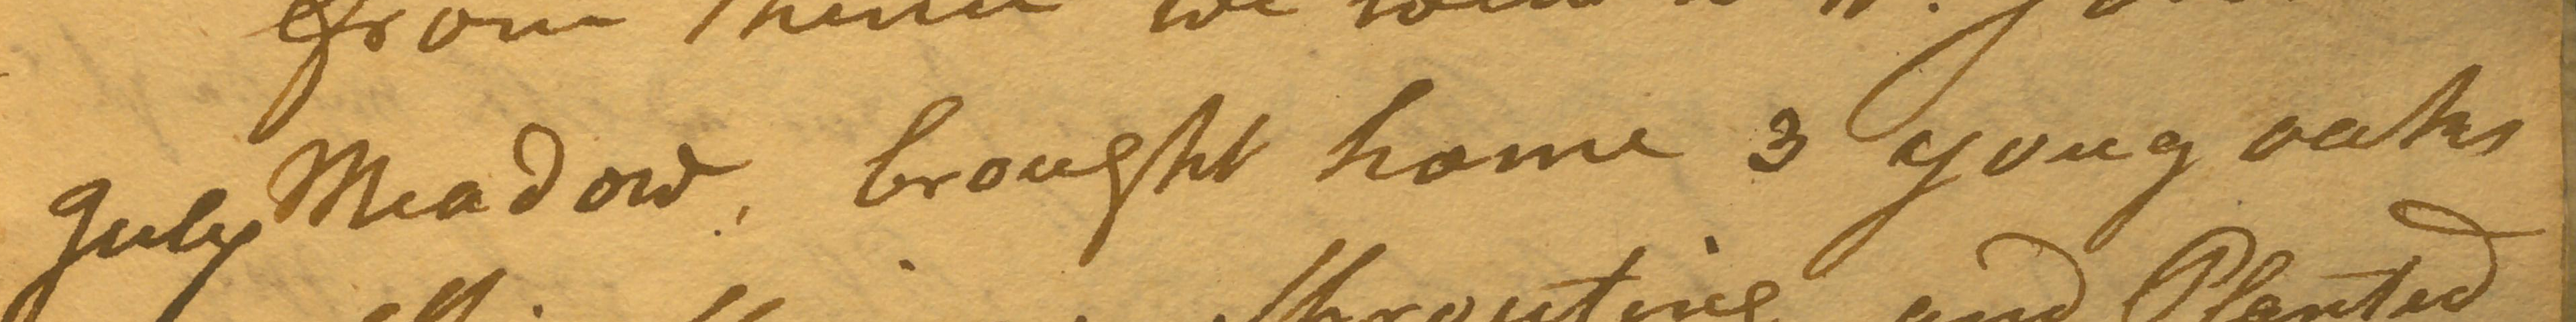July Meadow brought home 3 youg oaks
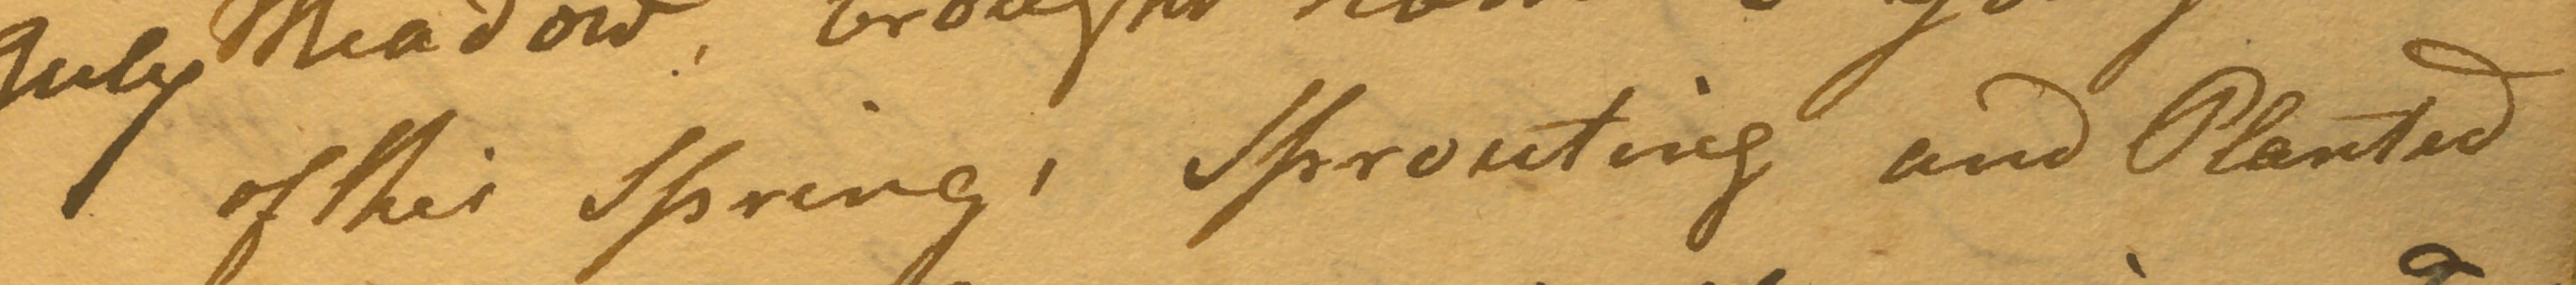of this Spring, Sprouting and Planted
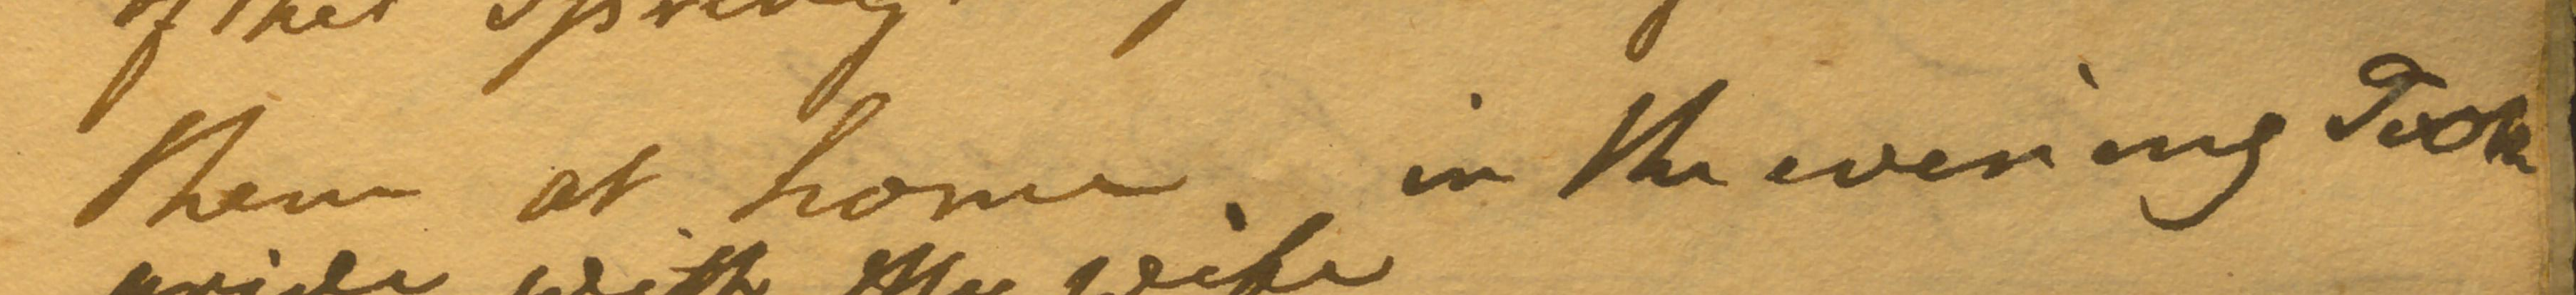them at home, in the evening Took
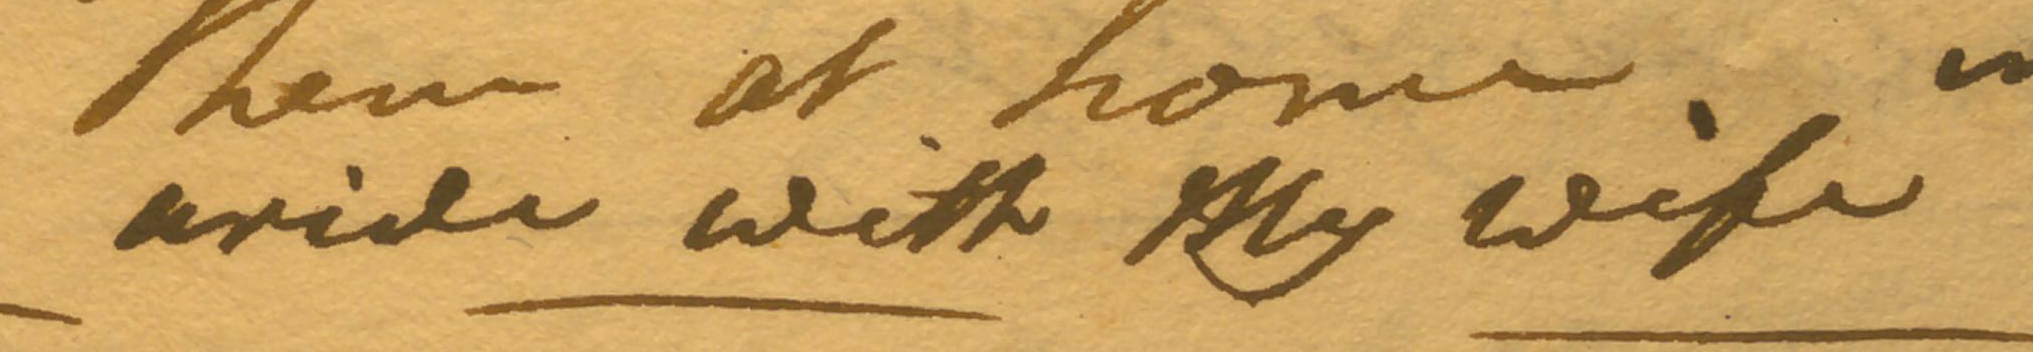a ride with My wife
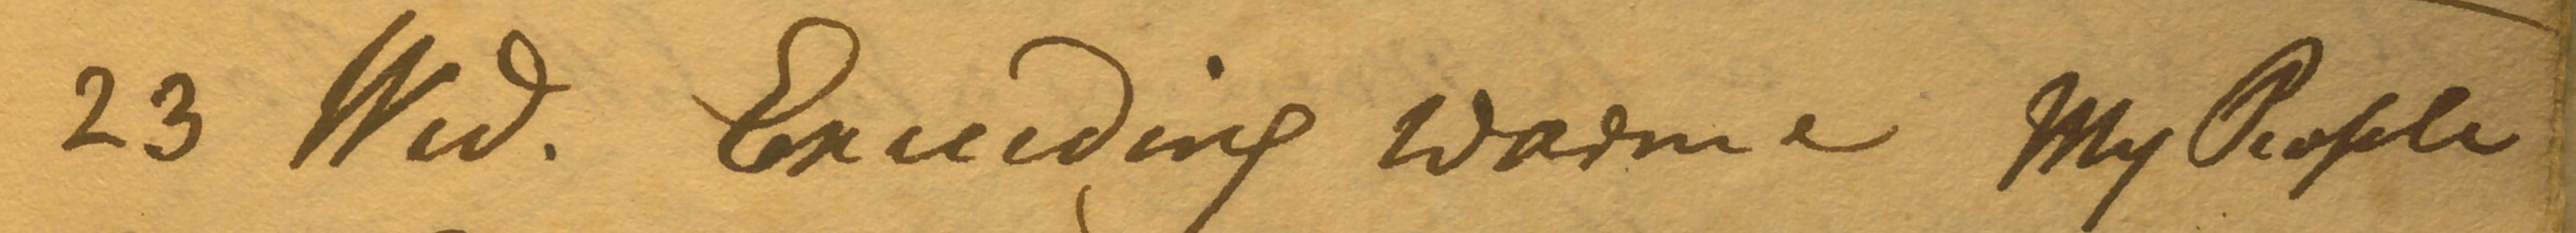23 Wed. Exceeding Warme My People
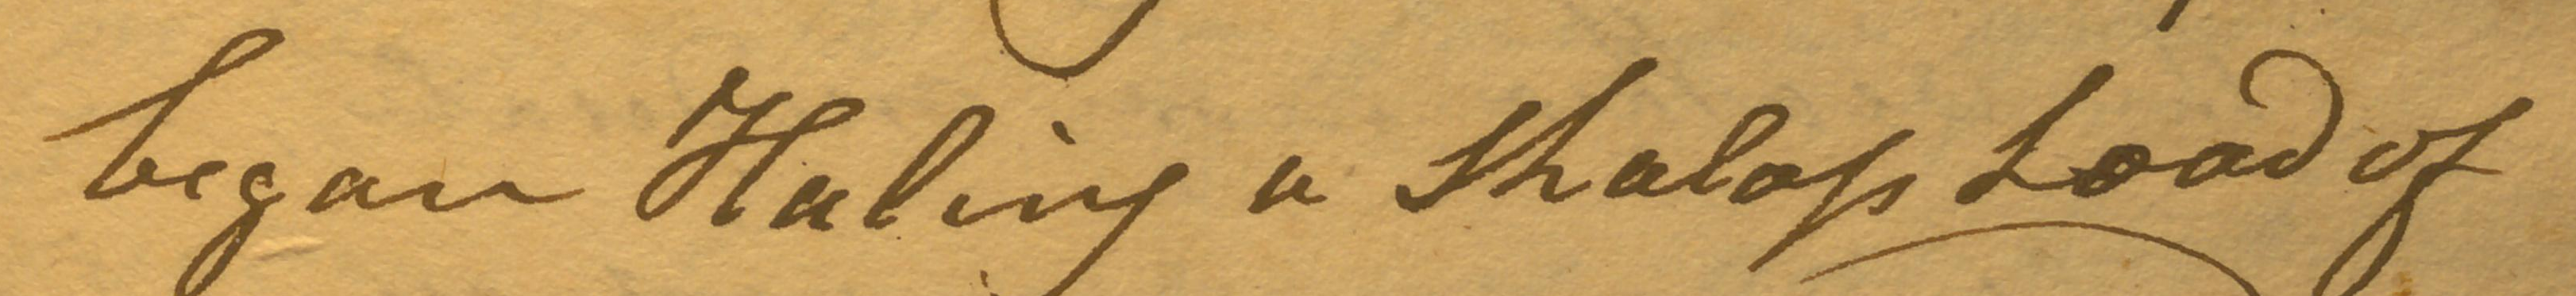begai Haling a Shalop Load of
